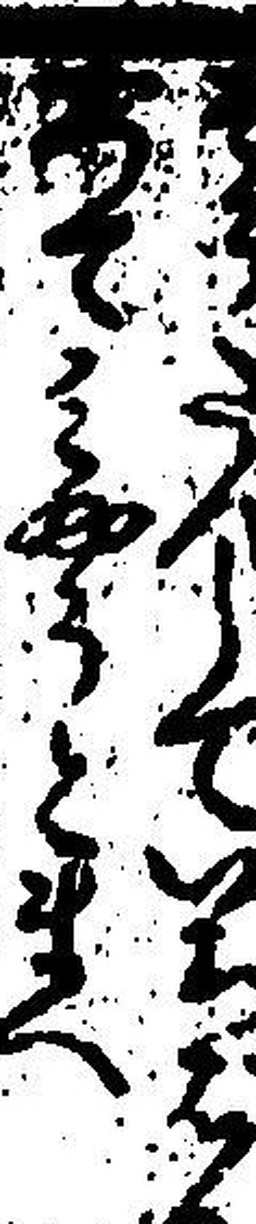てみやうとまへ
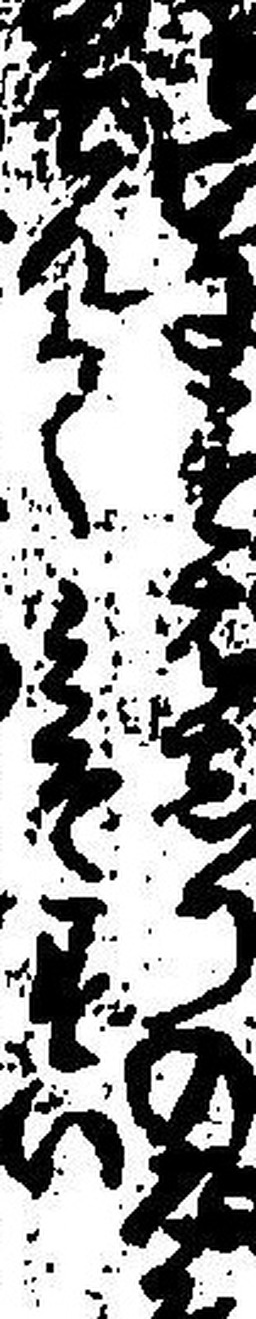のでんかくみそすい

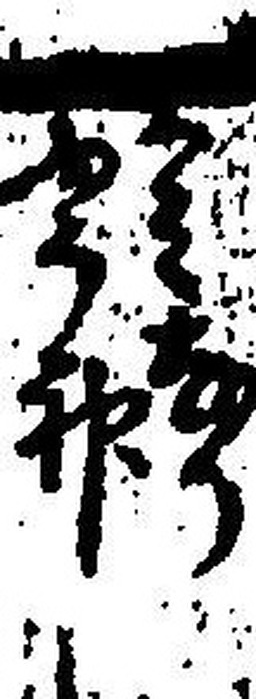ふう神
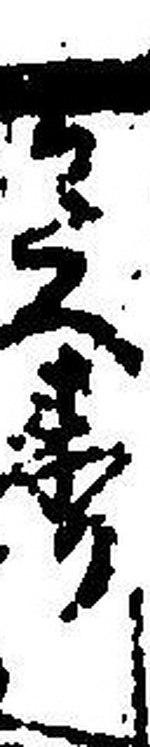かたへ来り
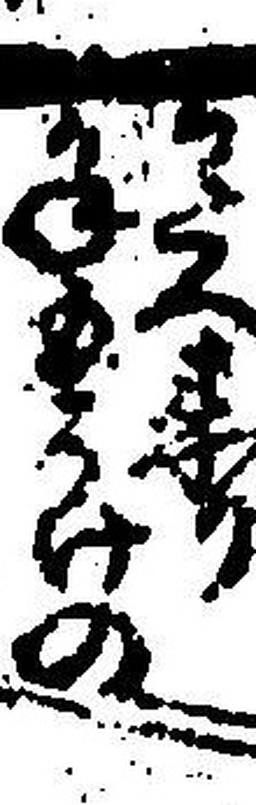かねもうけの
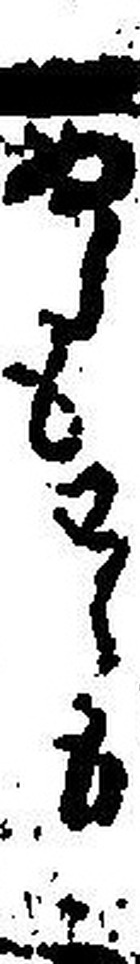ぬしもわしも
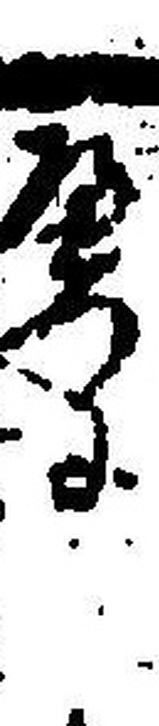へつに
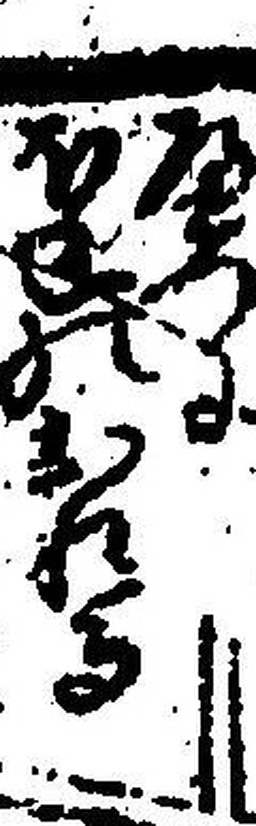ほねのおれる
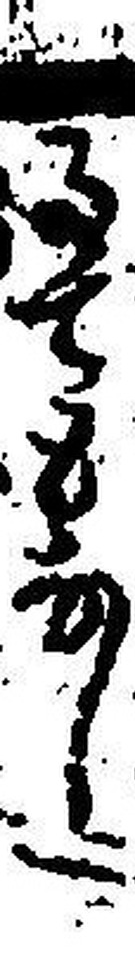事てもなし
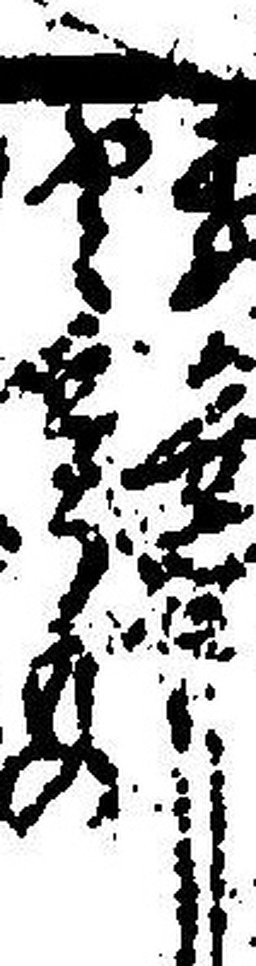ふらせうもの
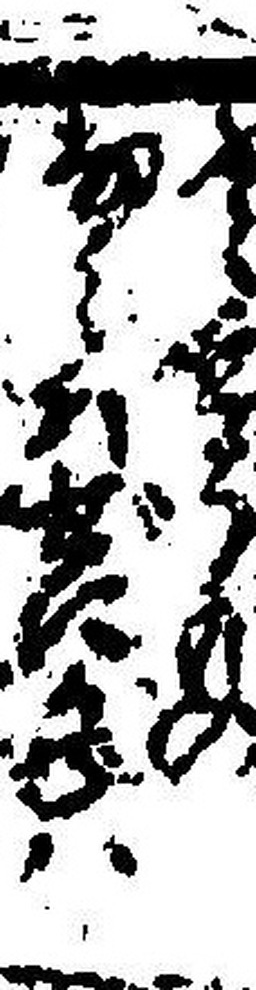ならはぜにかねは
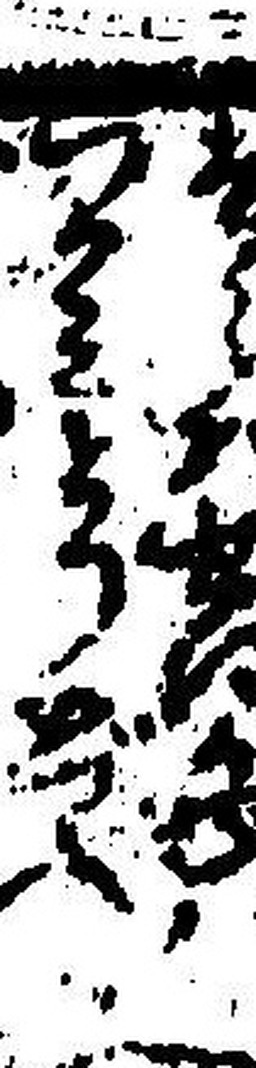つかみとりど
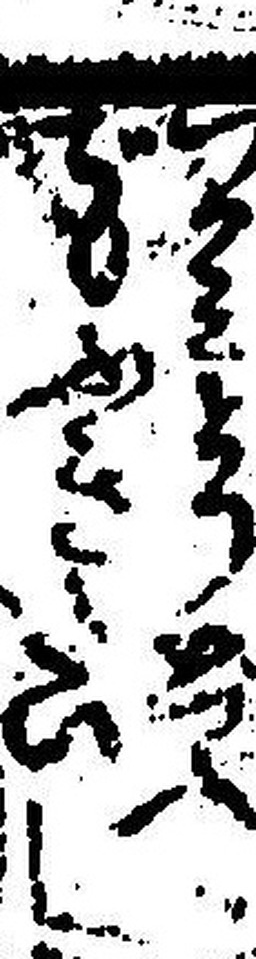でもふきたい
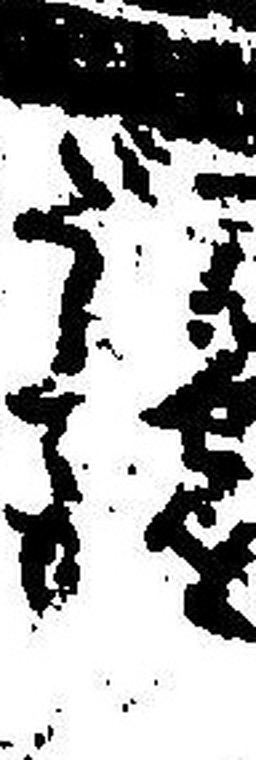だしても
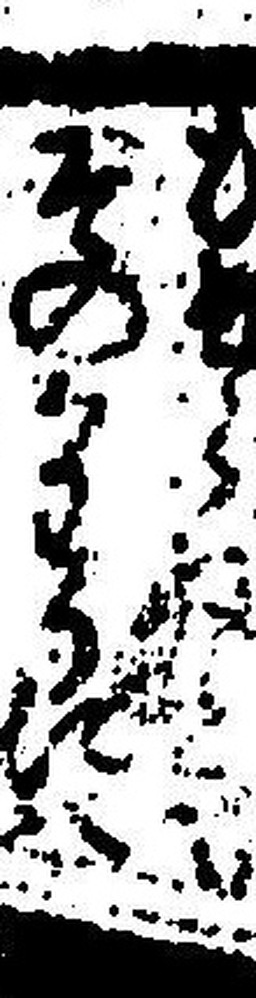そのかわりには
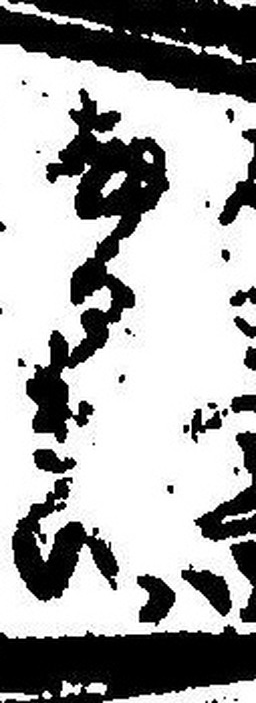なるまい
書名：天竺儲之筋 / 市場通笑作
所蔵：東京大学総合図書館 General Library in the University of Tokyo, JAPAN
